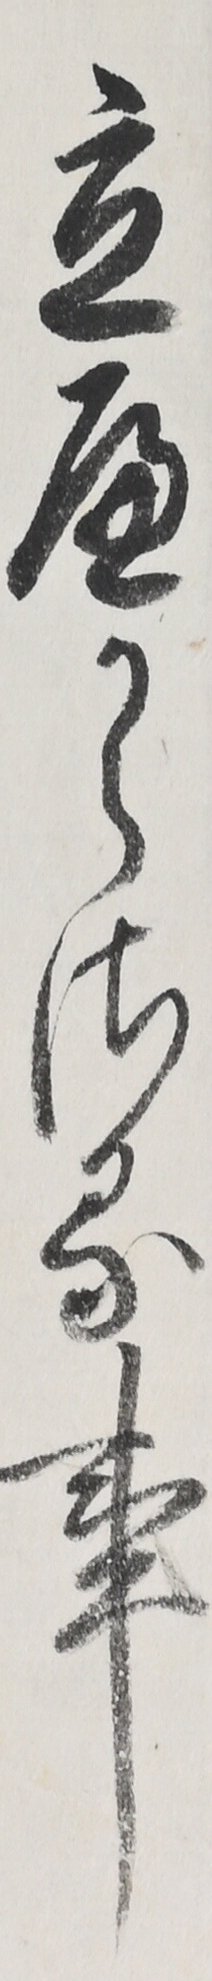立へからさる事
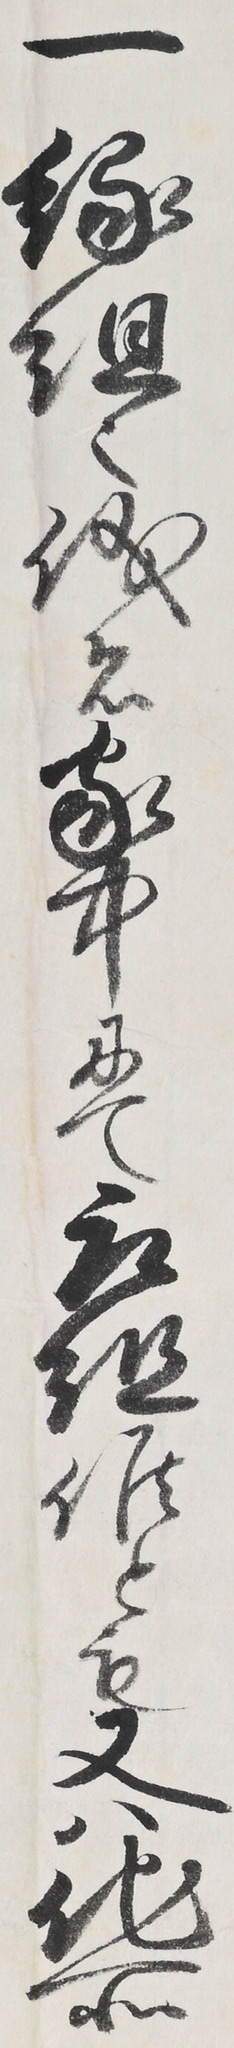一縁組之儀者家中にて取組候とも又ハ他所
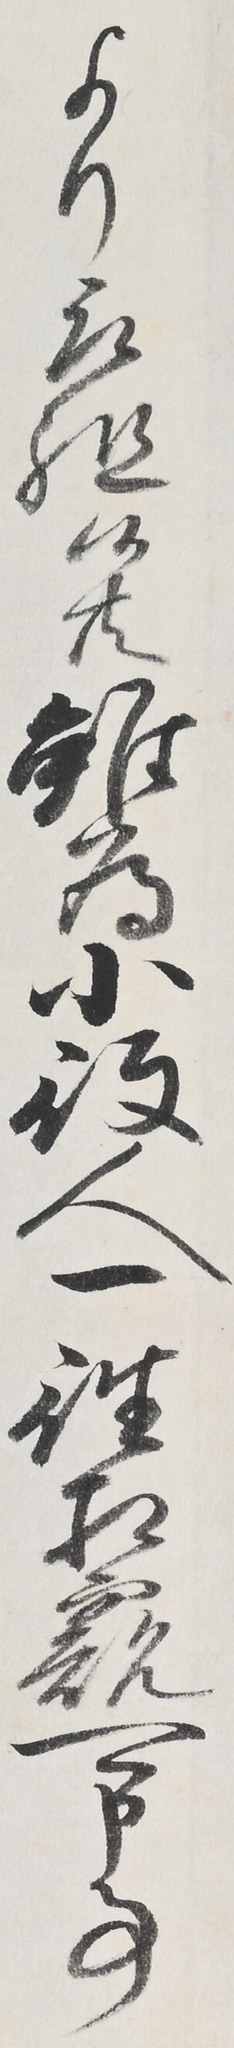より取組候共雖為小役人一往相窺可申事
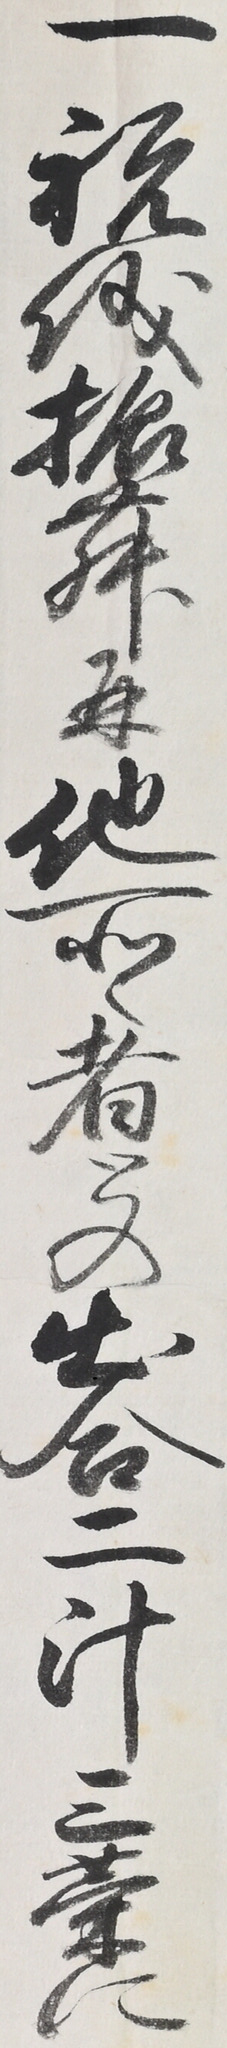一祝儀振舞幷他所之者との出合二汁三菜に
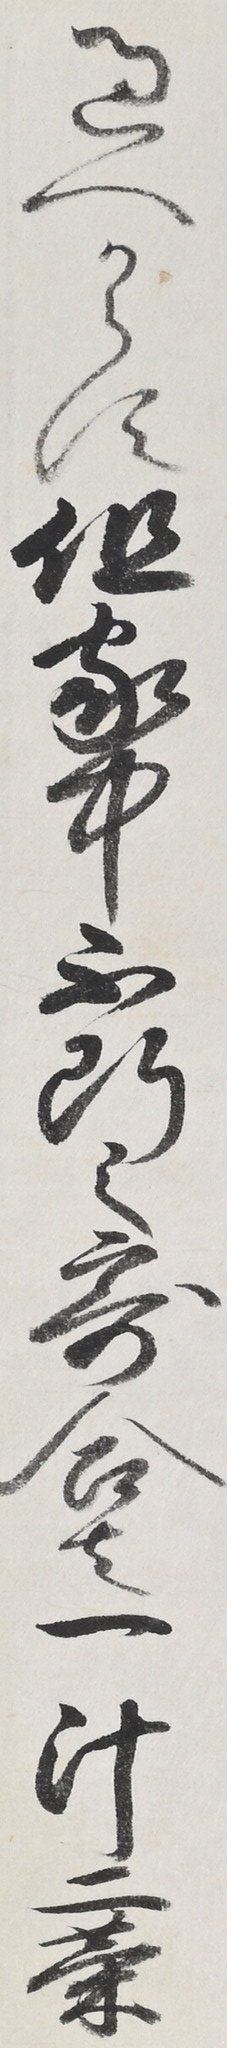過へからす但家中不断之寄合者一汁二菜
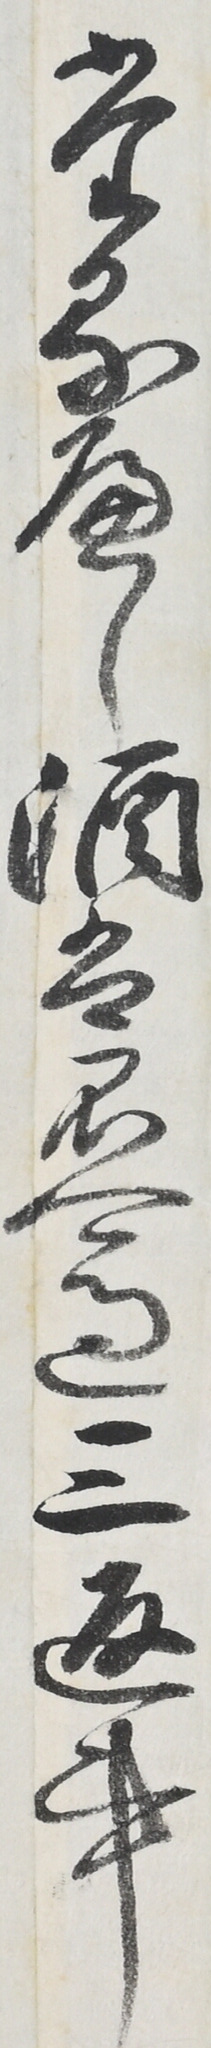たるへし酒は不可過三返事
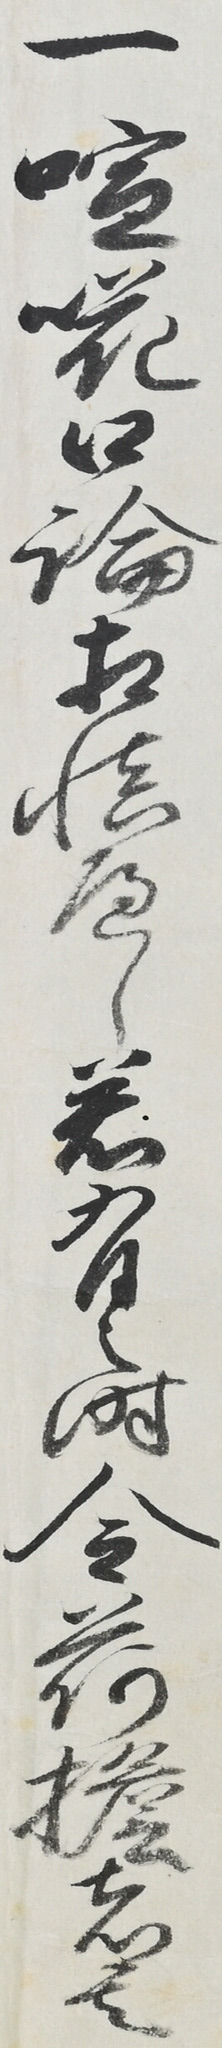一喧嘩口論相慎へし若有之時令荷擔者其
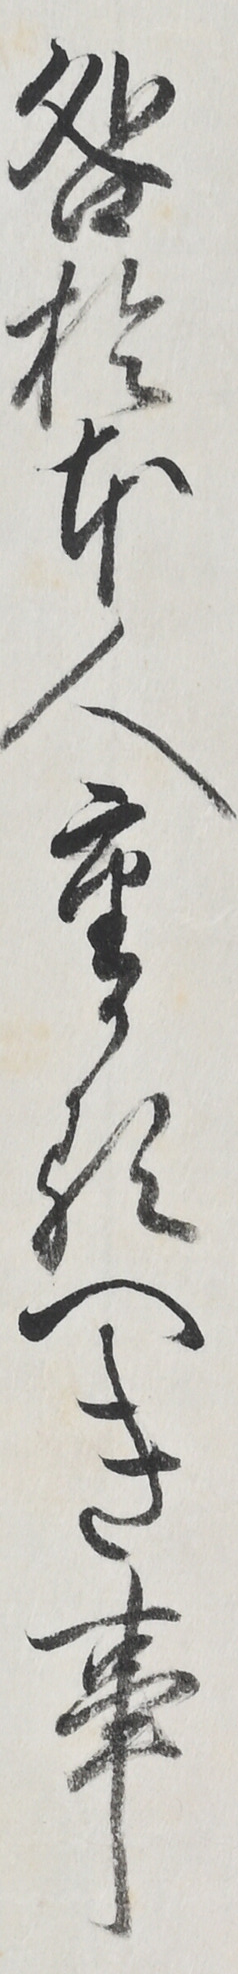咎於本人重かるへき事
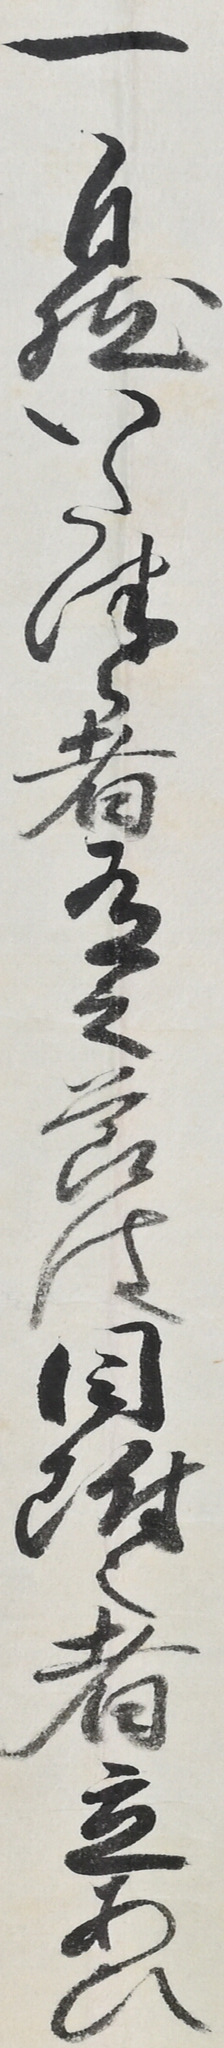一自然いたつら者有之節は目附之者立あひ
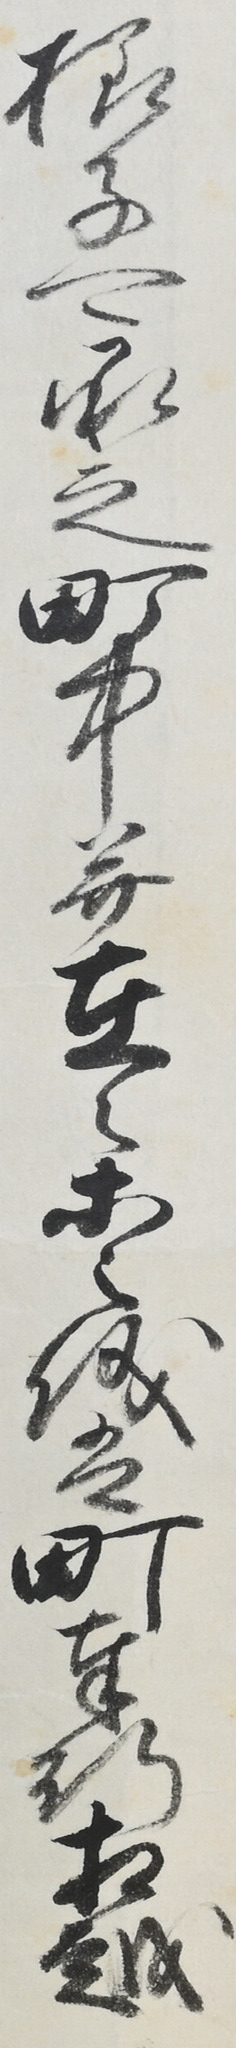様子可承之町中幷在々等之儀は町奉行相越
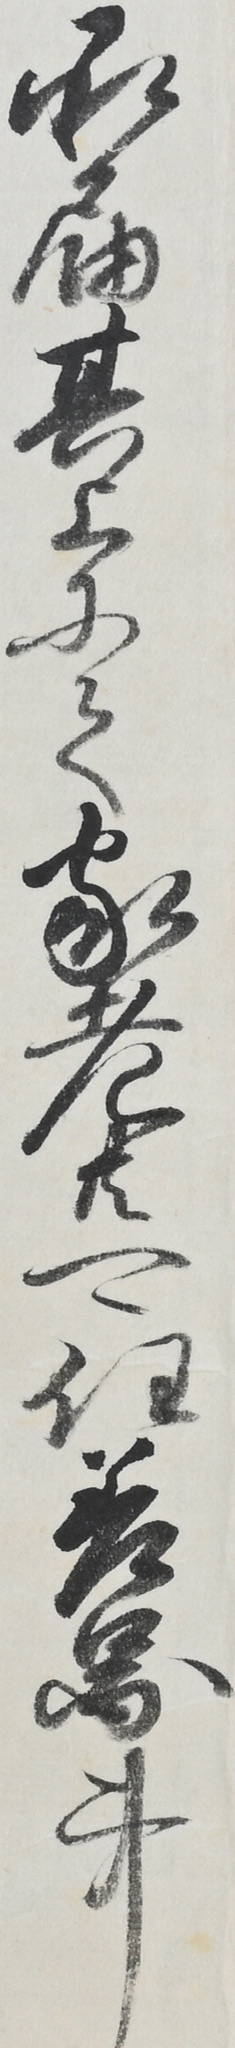承届其上にて家老共可任差図事
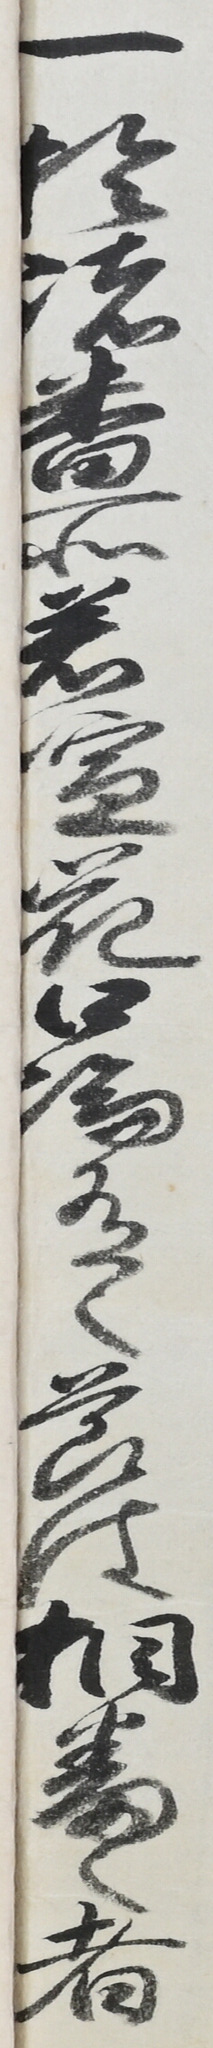一於諸番所若喧嘩口論有之節は相番之者

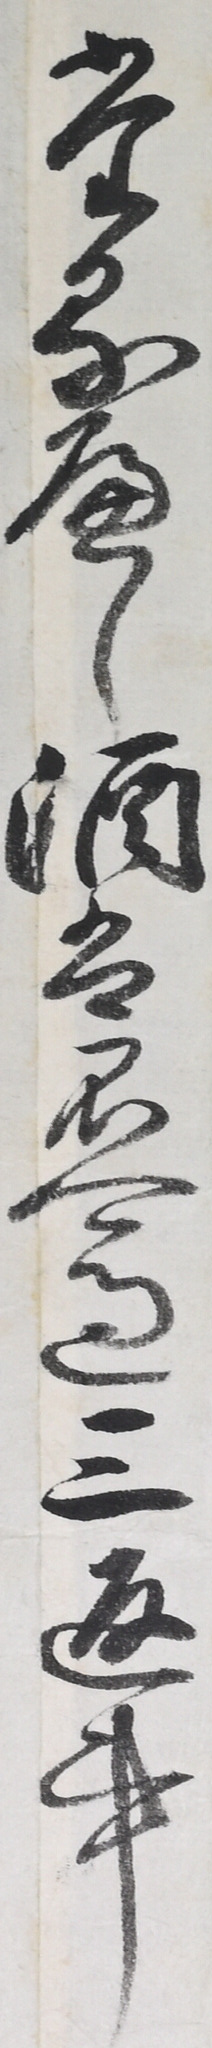たるへし酒は不可過三返事
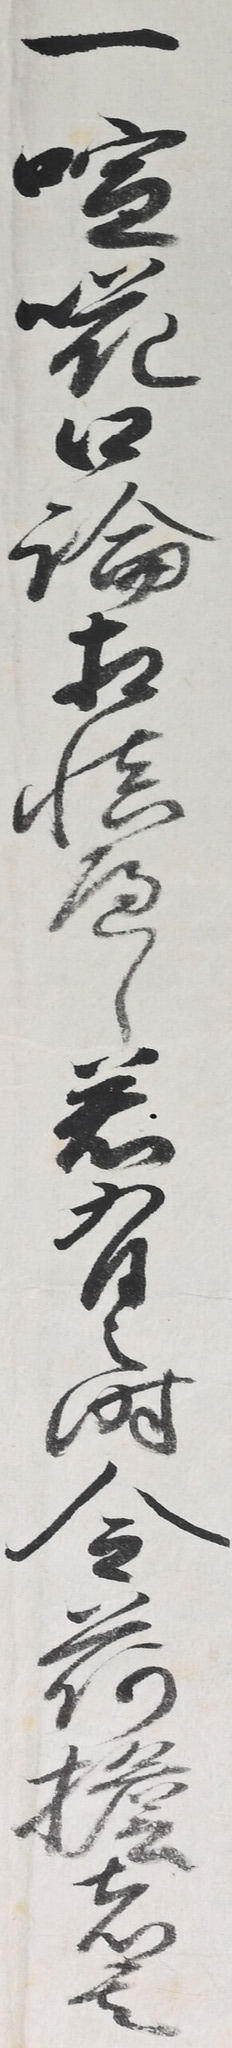一喧嘩口論相慎へし若有之時令荷擔者其
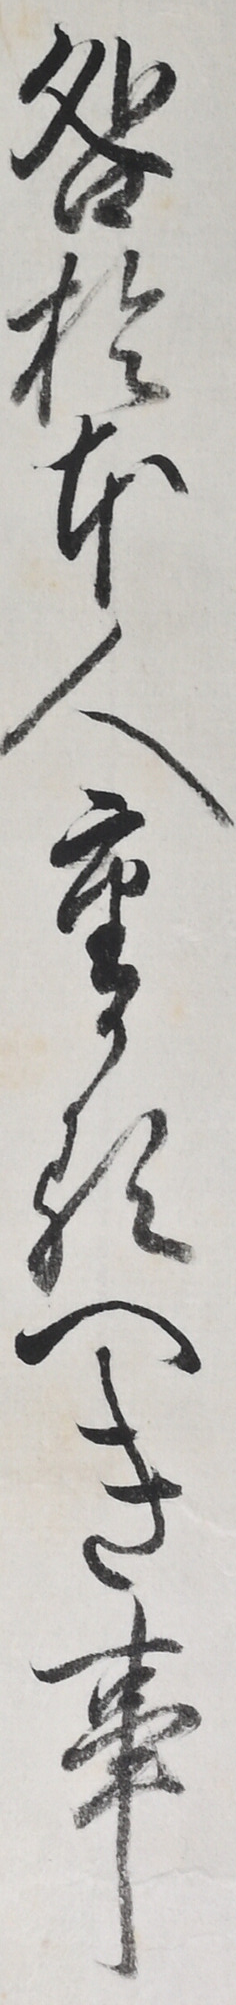咎於本人重かるへき事
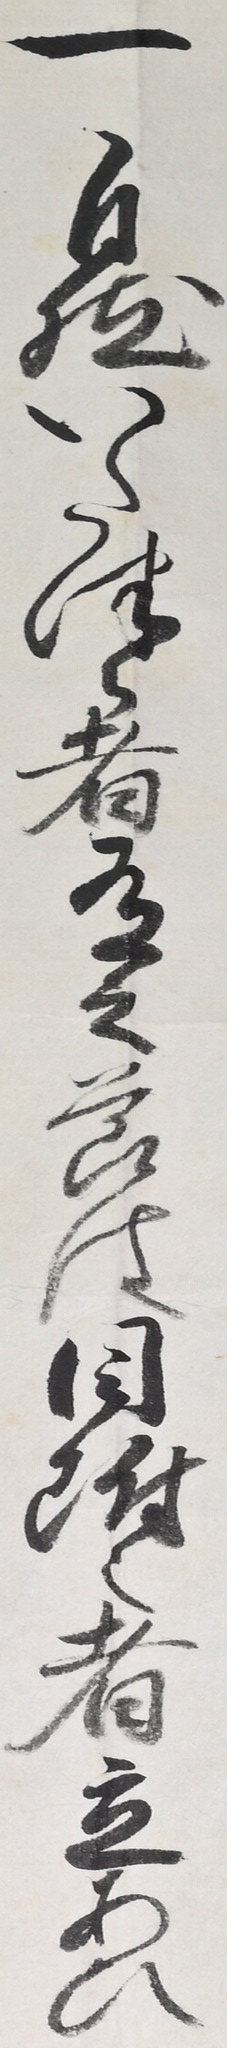一自然いたつら者有之節は目附之者立あひ
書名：御条目
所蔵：伊那市立高遠町図書館・合同会社AMANE
